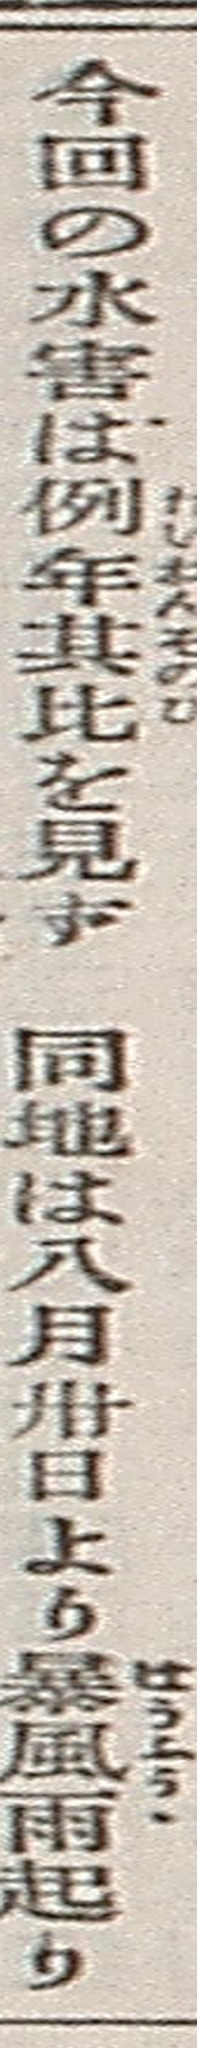今回の水害は例年其比を見ず同地は八月卅日より暴風雨起り
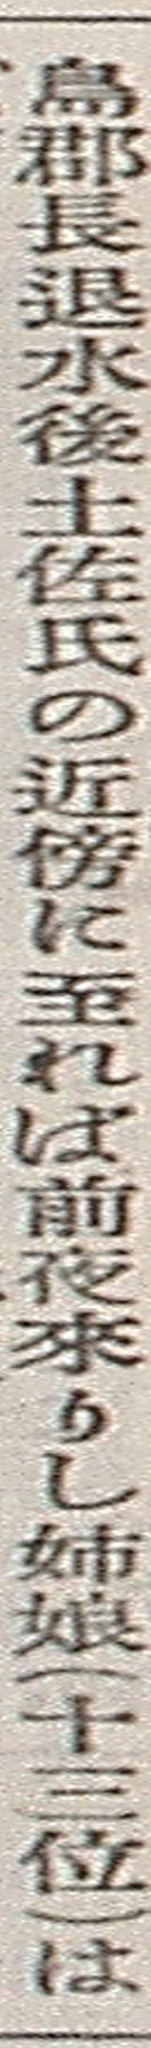島郡長退水後土佐氏の近傍に至れば前夜来りし姉娘は
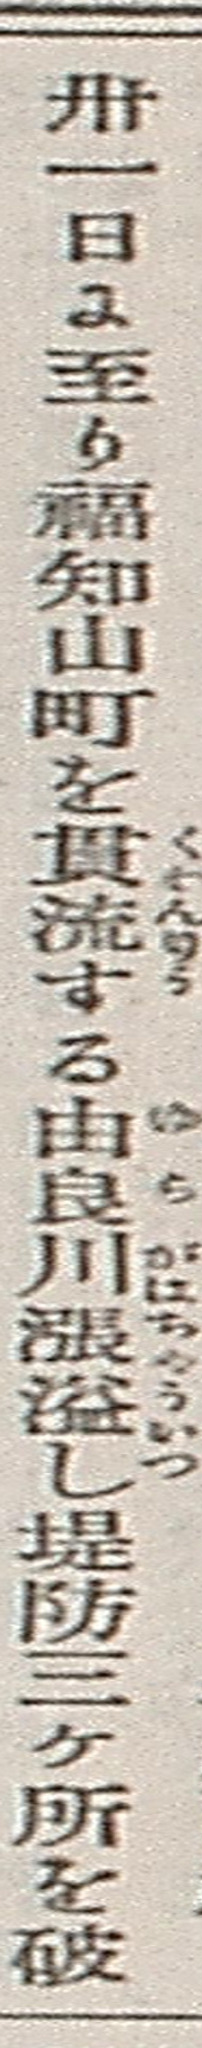卅一日に至り福知山町を貫流する由良川漲溢し堤防三ヶ所を破
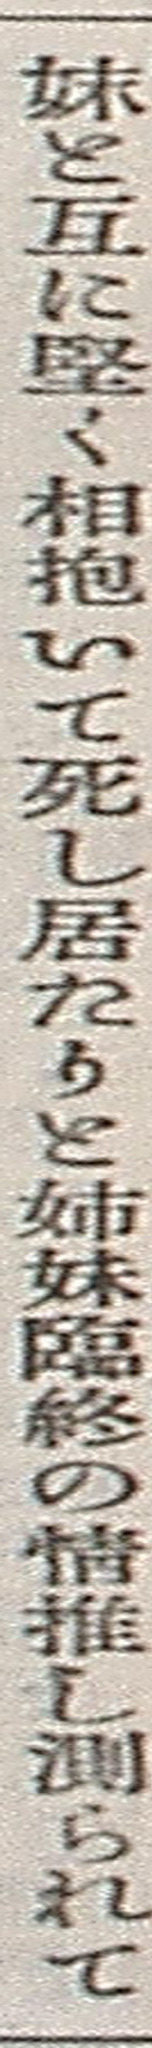妹と互に堅く相抱いて死し居たりと姉妹臨終の情推し測られて

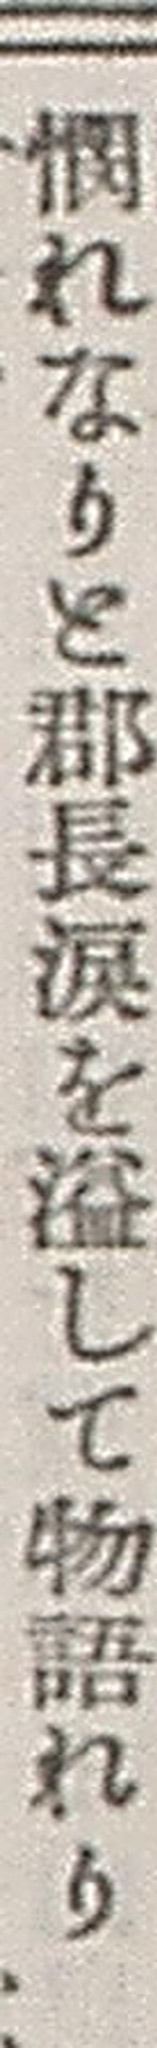憫れなりと郡長涙を溢して物語れり
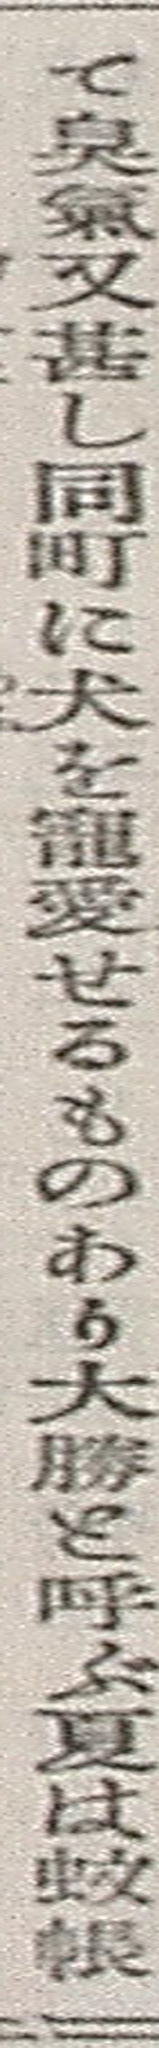て臭気又甚し同町に犬を寵愛せるものあり大勝と呼ぶ夏は蚊帳
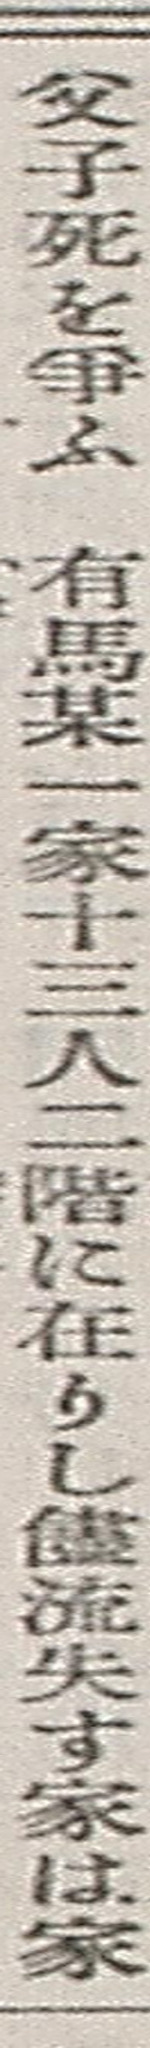父子死を争ふ有馬某一家十三人二階に在りし儘流失す家は家
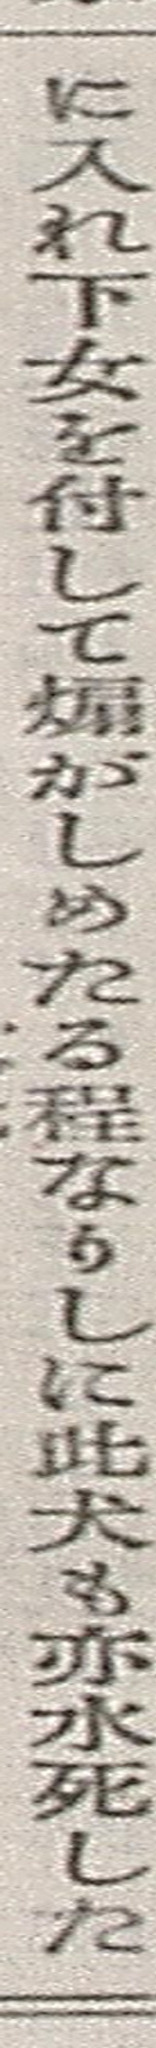に入れ下女を付して煽がしめたる程なりしに此犬も亦水死した
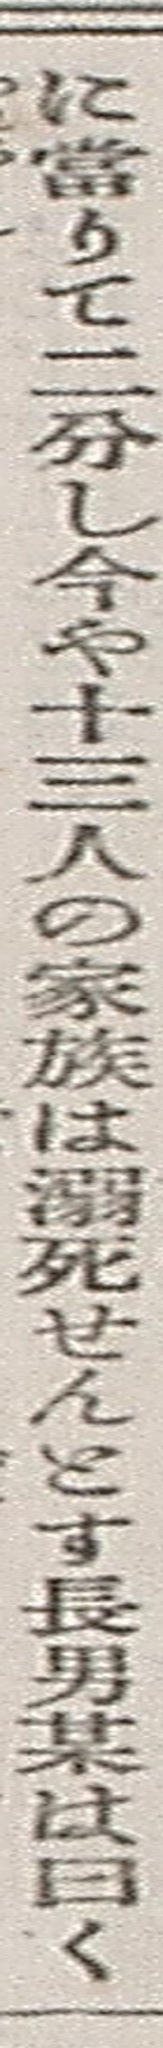に当りて二分し今や十三人の家族は溺死せんとす長男某は曰く
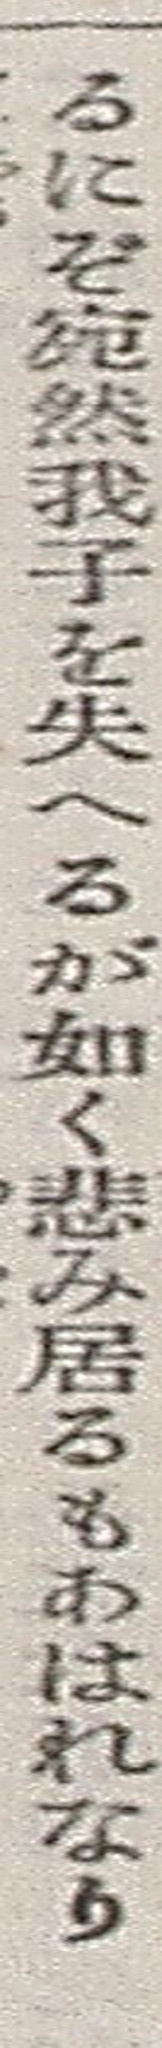るにぞ宛然我子を失へるが如く悲み居るもあはれなり
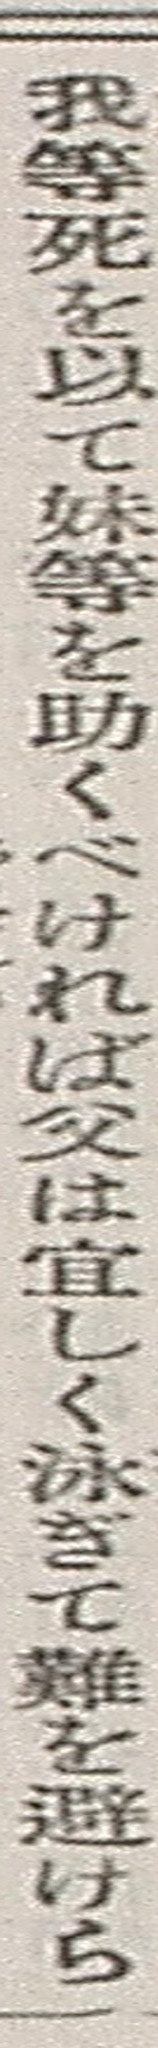我等死を以て妹等助くべければ父は宜しく泳ぎて難を避けら
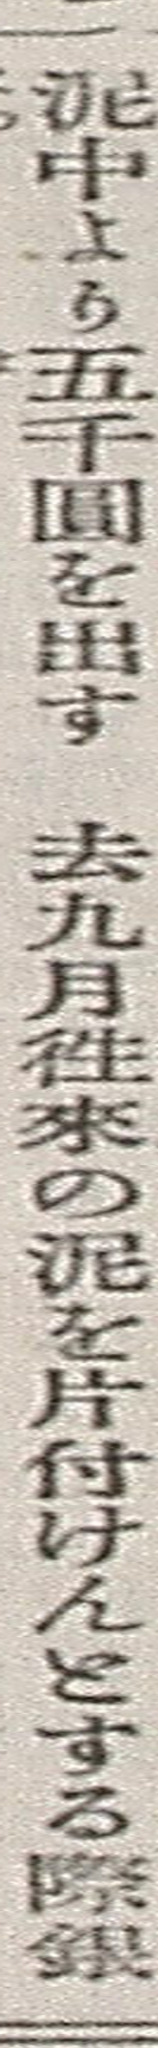泥中より五千円を出す去九月往来の泥を片付けんとする際銀
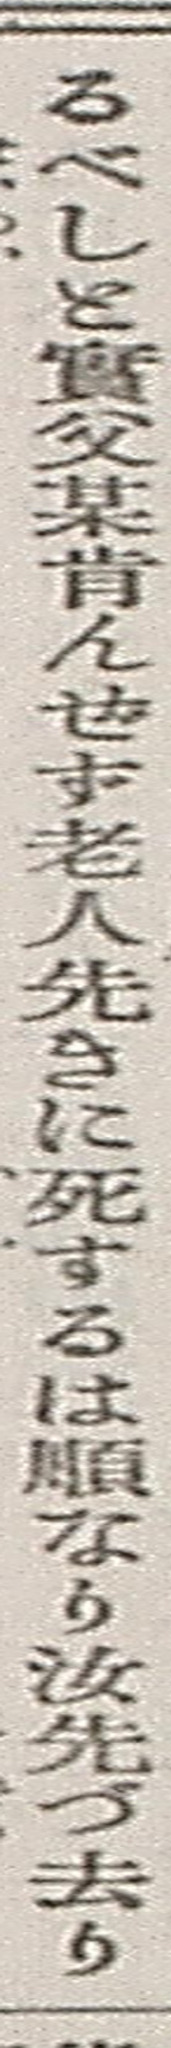るべしと実父某肯んぜず老人先きに死するは順なり汝先づ去り
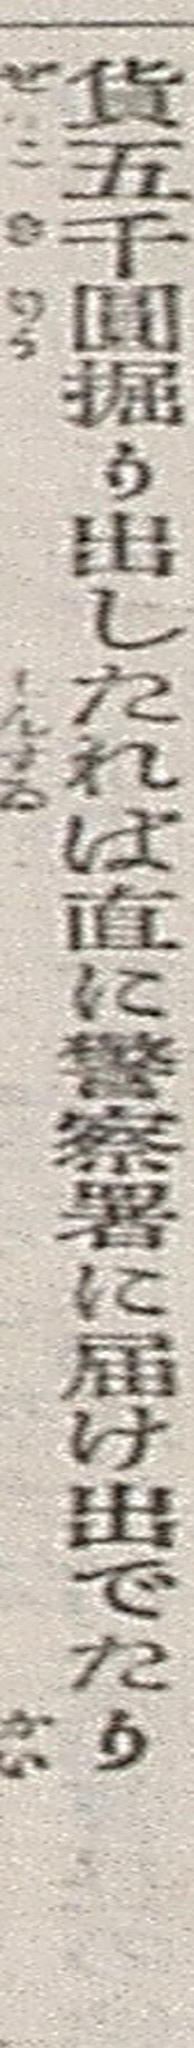貨五千円堀り出したれば直に警察署に届け出でたり
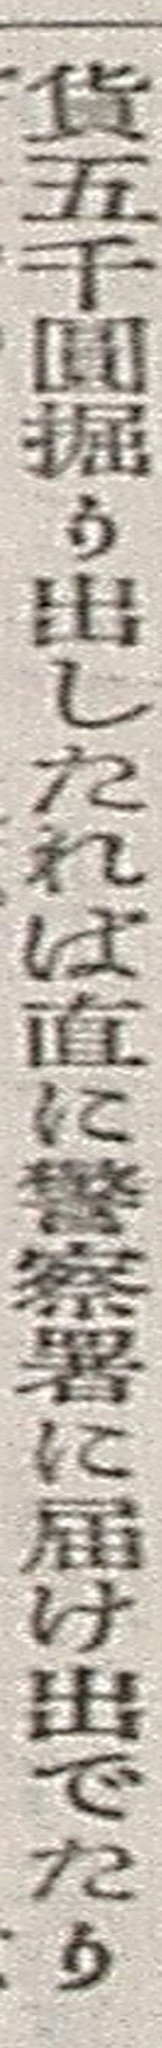貨五千円堀り出したれば直に警察署に届け出でたり
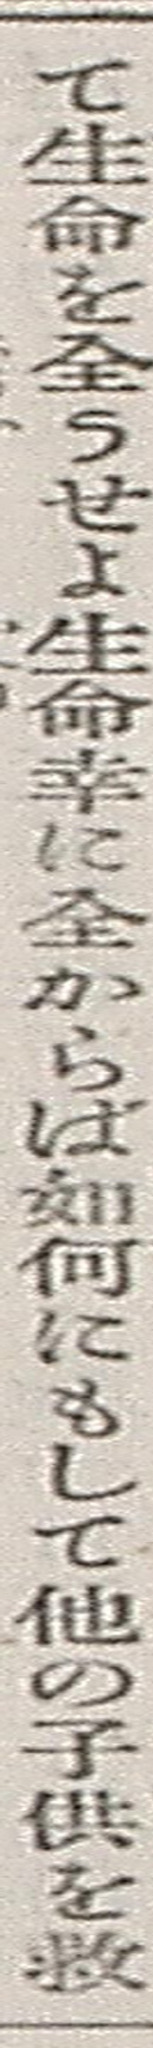て生命を全うせよ生命幸に全からば如何にしても他の子供を救う
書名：風俗畫報臨時増刊第百二十六號　洪水被害録（中）
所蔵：東京大学地震研究所図書室 Earthquake Research Institute Library, The University of Tokyo, JAPAN
